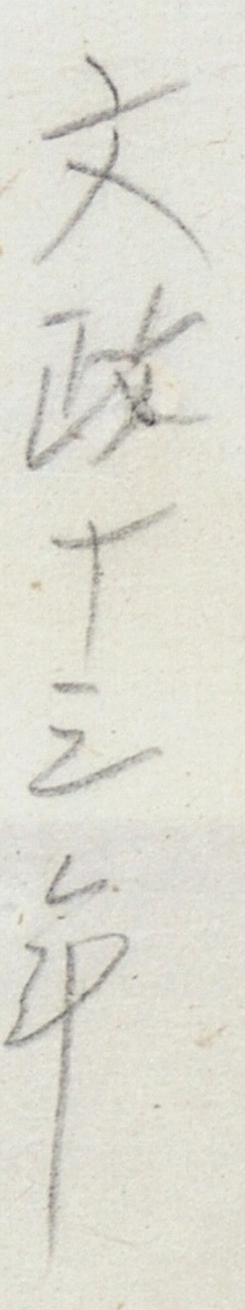文政十三年
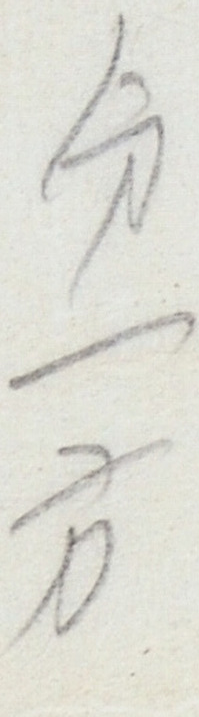分一方
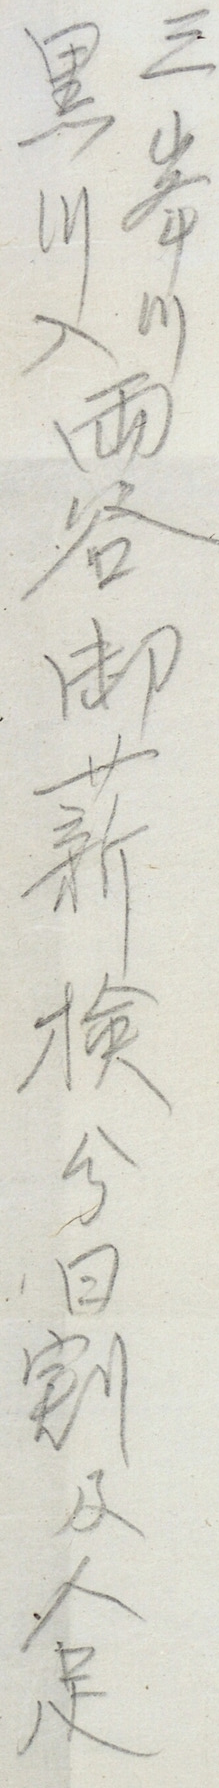黒川入両谷御薪検分日割及人足
